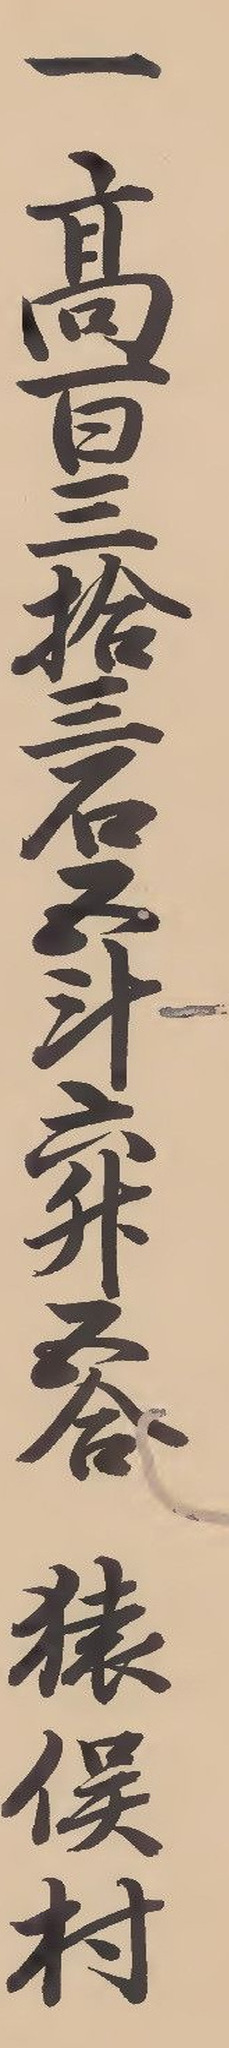一高百三拾三石五斗六升五合猿俣村
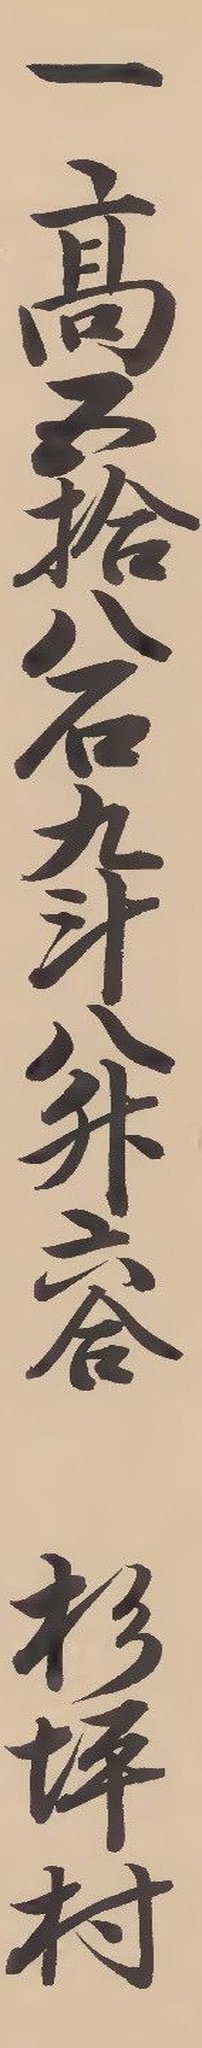一高五拾八石九斗八升六合杉坪村
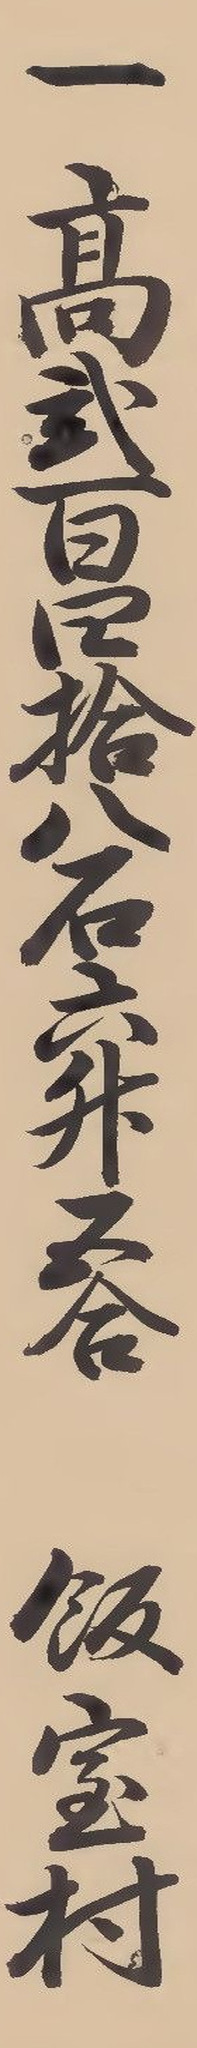一高弐百四拾八石六升五合飯室村
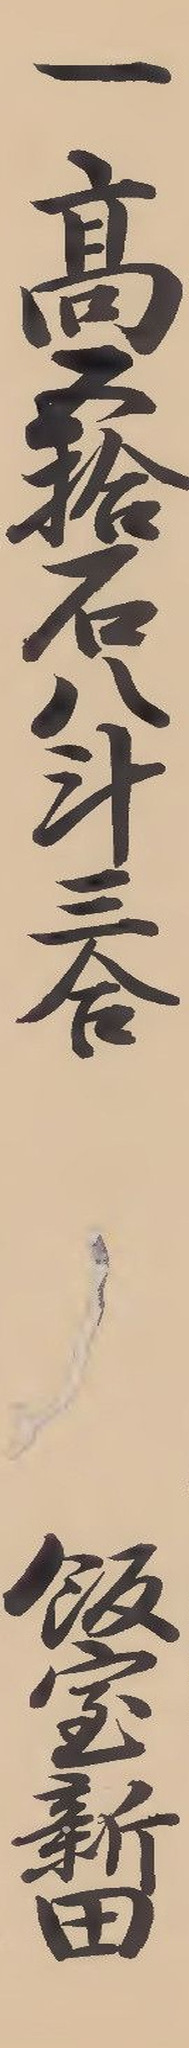一高五拾石八斗三合飯室新田
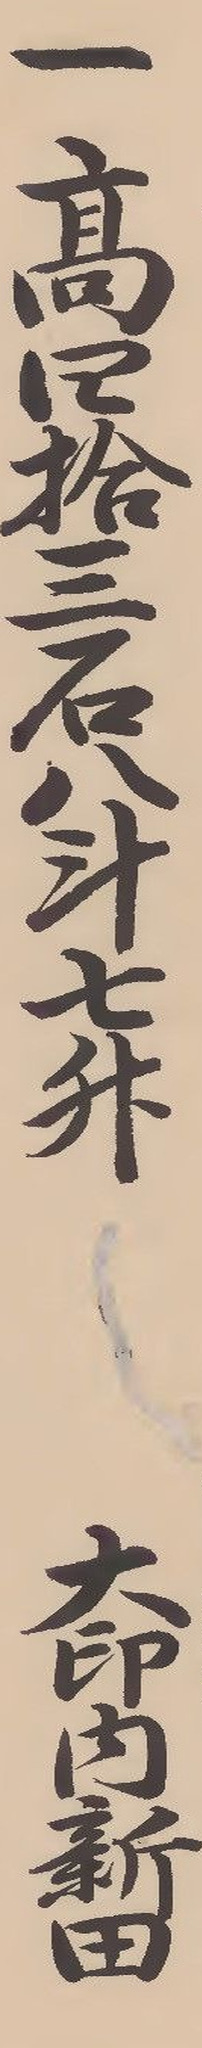一高四拾三石八斗七升大印内新田
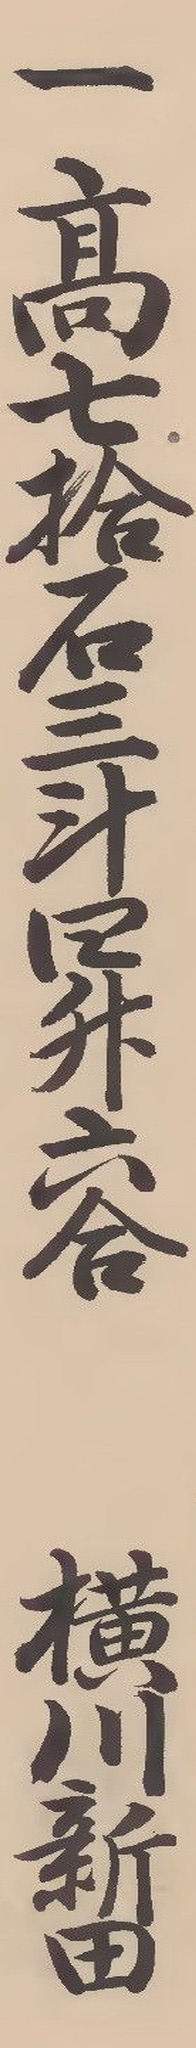一高七拾石三斗四升六合横川新田
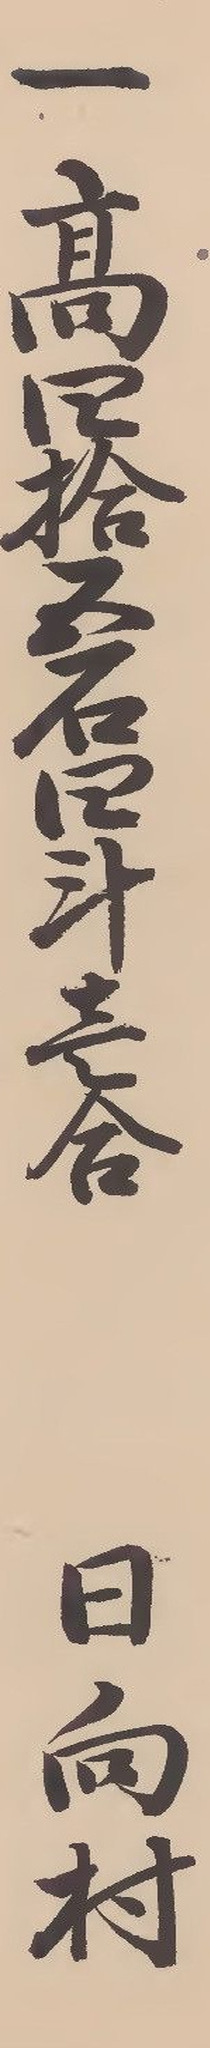一高四拾五石四斗壱合日向村
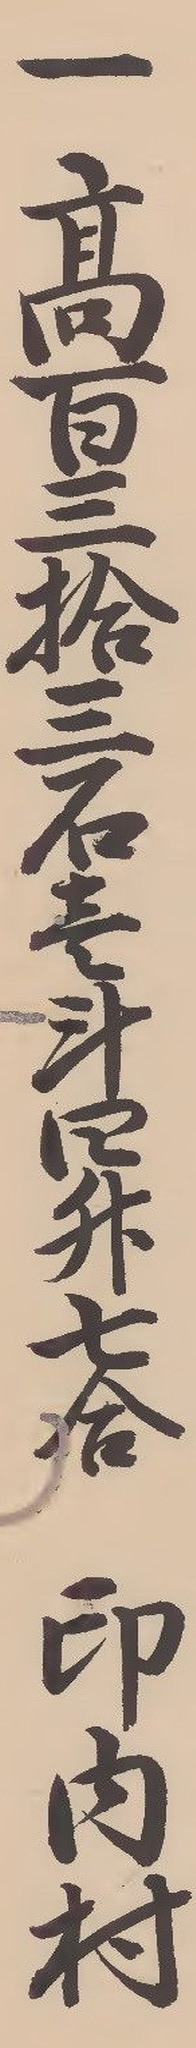一高百三拾三石壱斗四升七合印内村

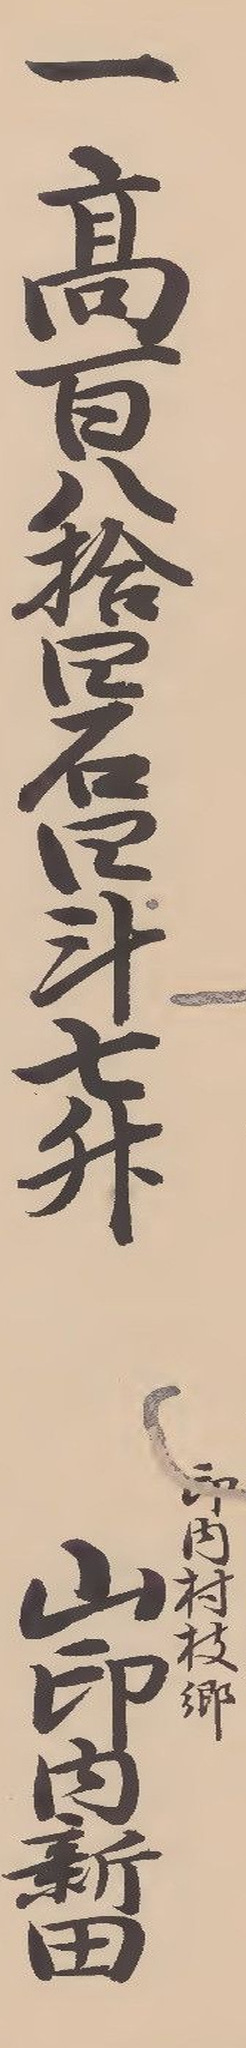一高百八拾四石四斗七升山印内新田
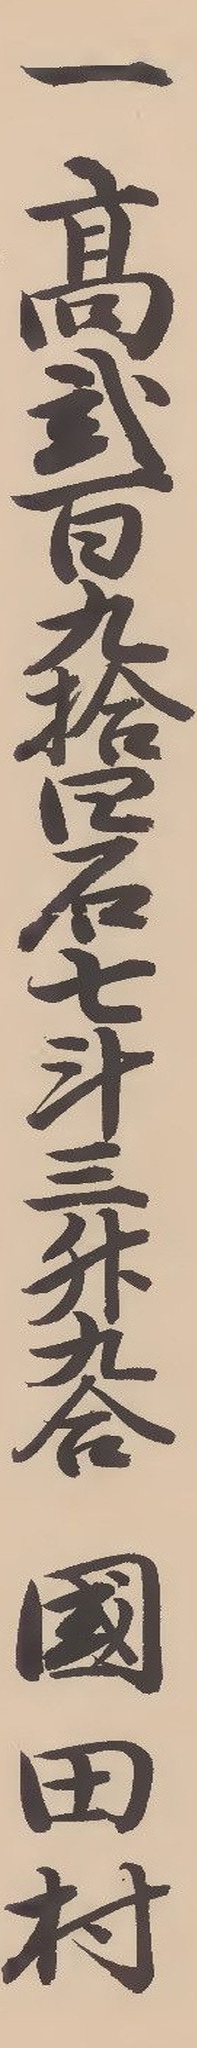一高弐百九拾四石七斗三升九合国田村
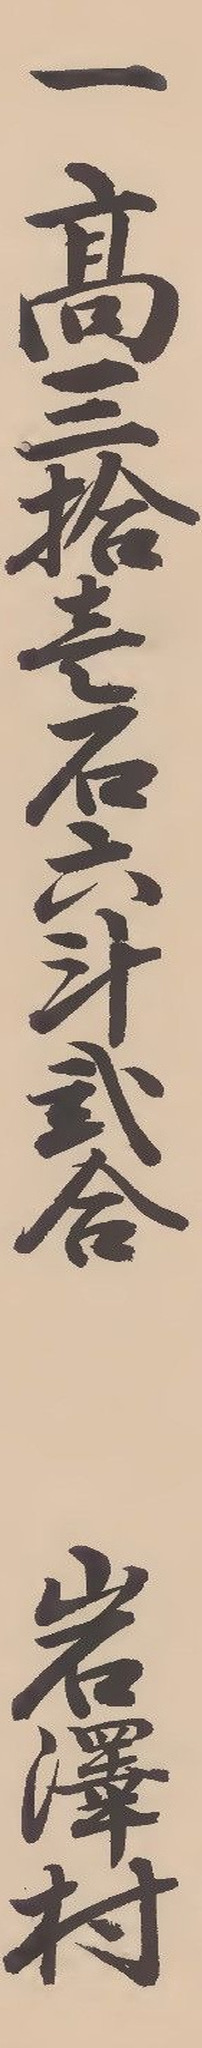一高三拾壱石六斗弐合岩沢村
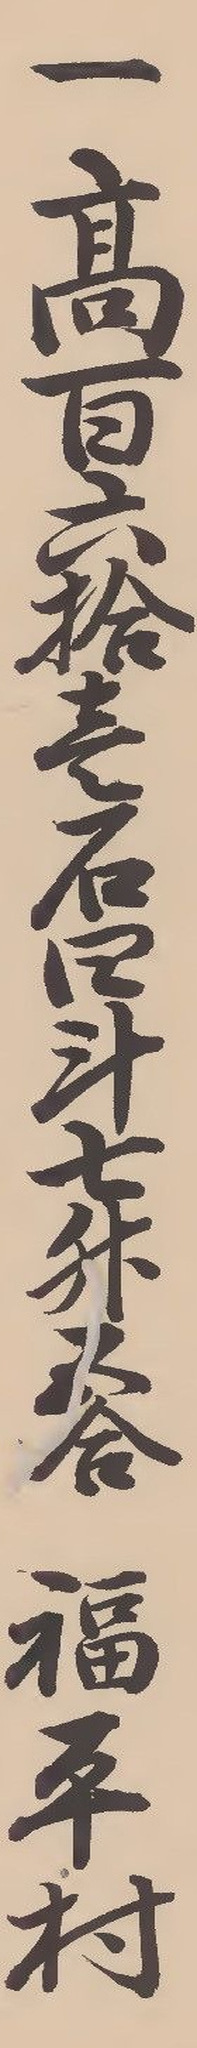一高百六拾壱石四斗七升五合福平村
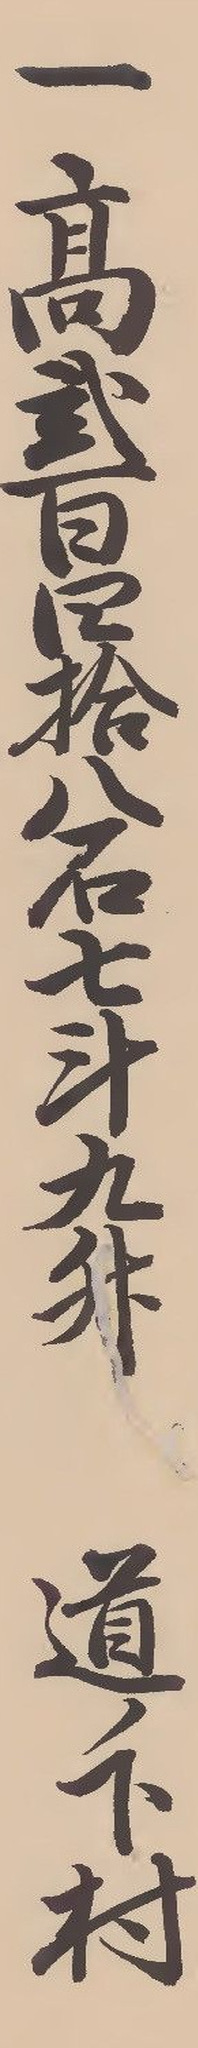一高弐百四拾八石七斗九升道ノ下村
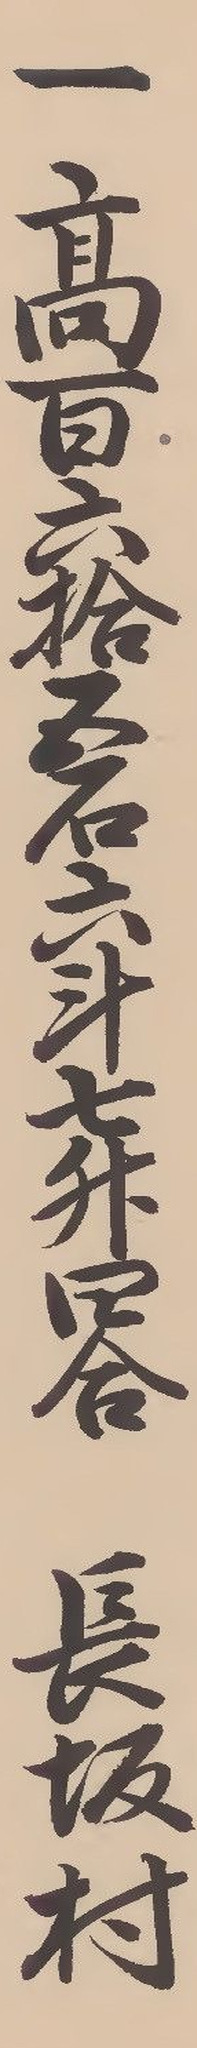一高百六拾五石六斗七升四合長坂村
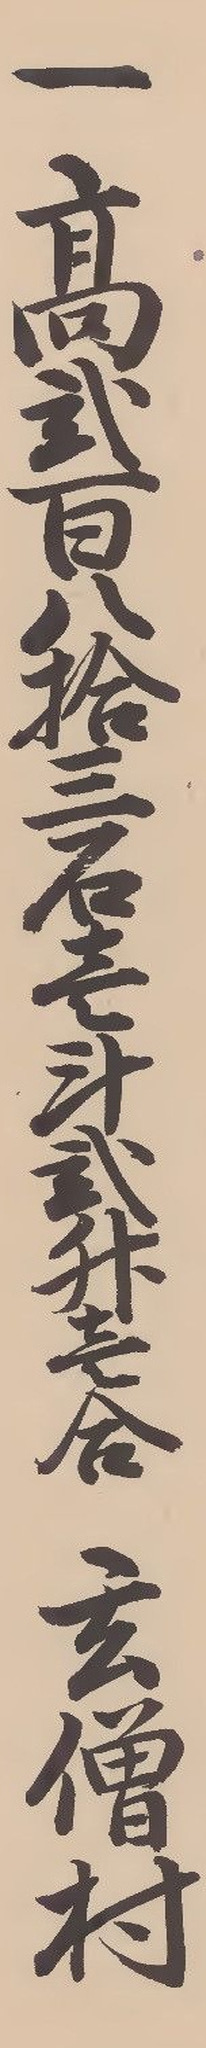一高弐百八拾三石壱斗弐升壱合玄僧村
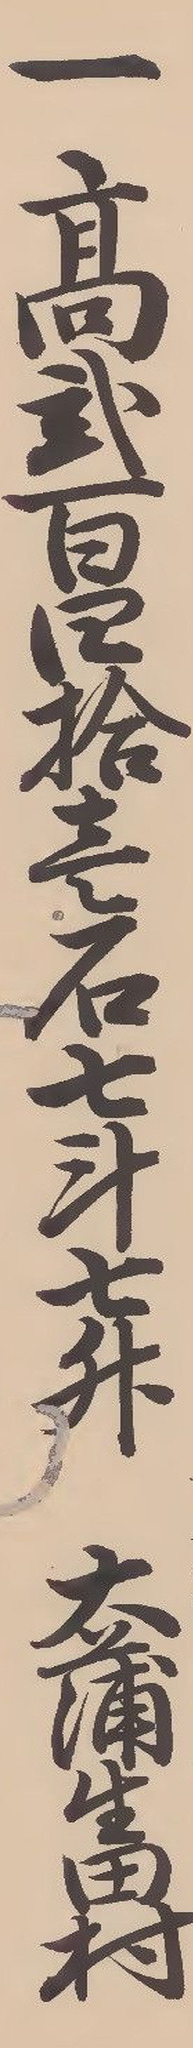一高弐百四拾壱石七斗七升大蒲生田村
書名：越後国郷帳　上
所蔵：国立公文書館 National Archives of Japan
